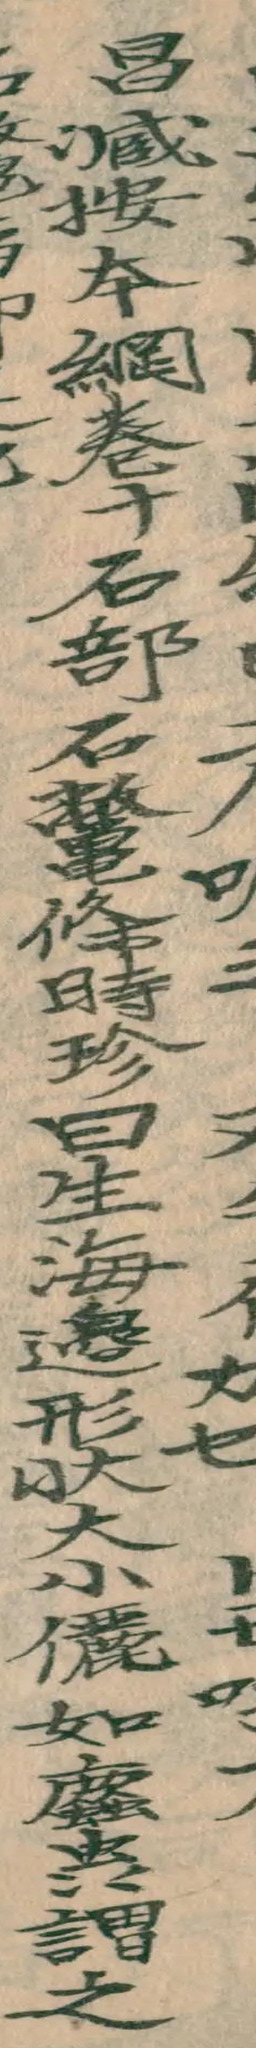昌臧按本綱巻十石部石鼈條時珍曰生海邉形状大小儷如䗪蟲謂之
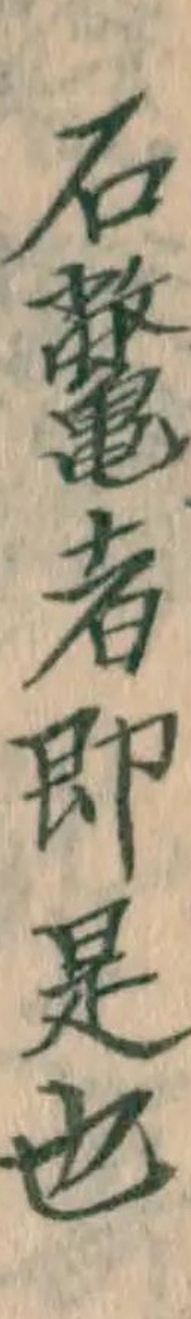石鼈者即是也
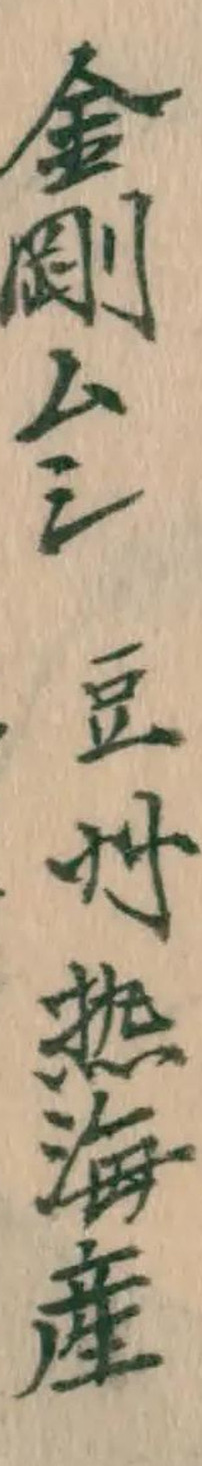金剛ムシ豆州熱海産
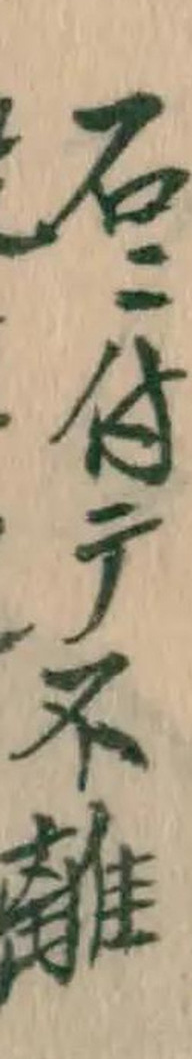石ニ付テ不離
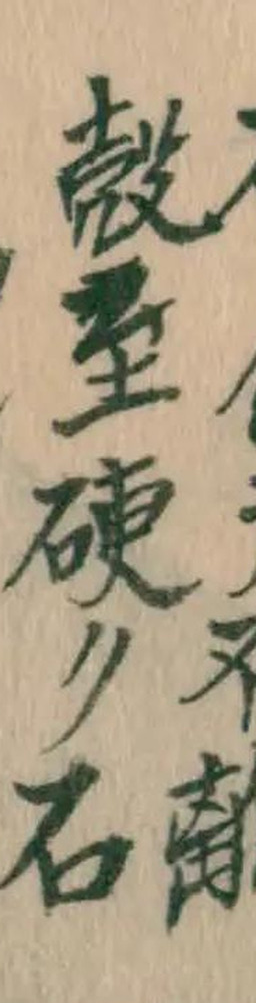殻至硬ク石
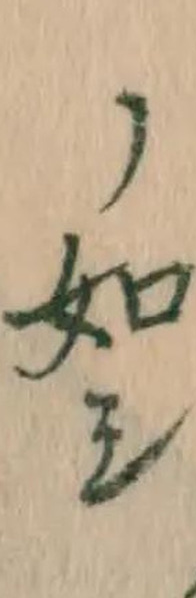ノ如シ
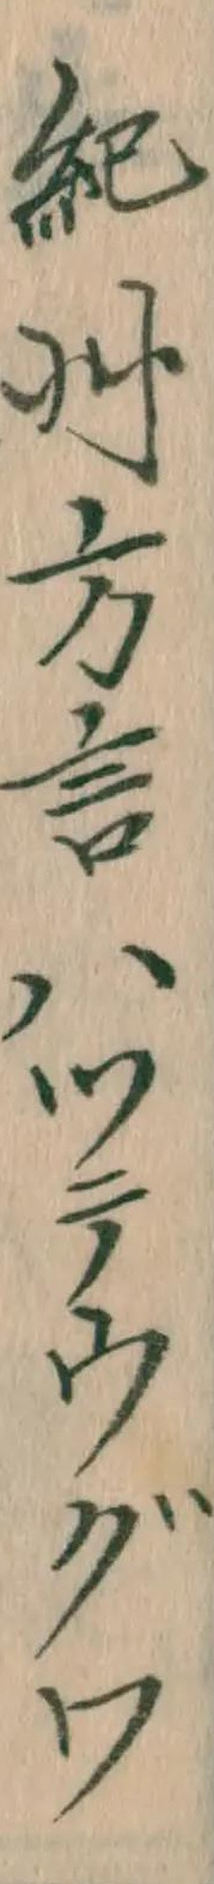紀州方言ハツテウグソ
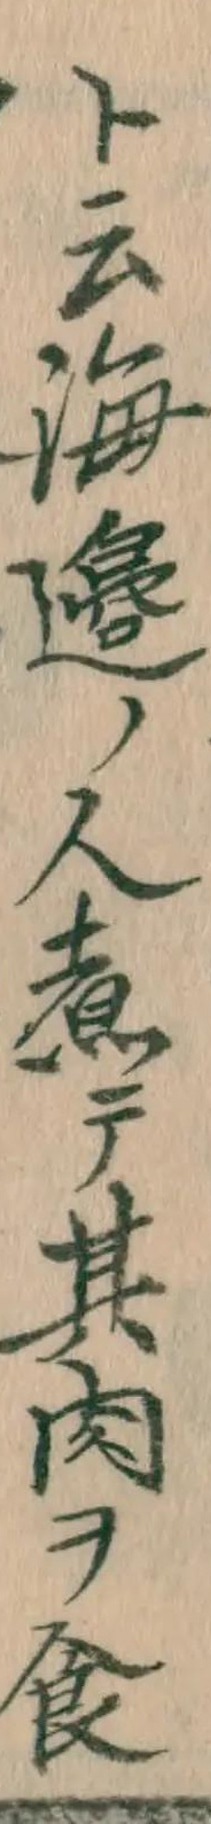ト云海邉ノ人煮テ其肉ヲ食
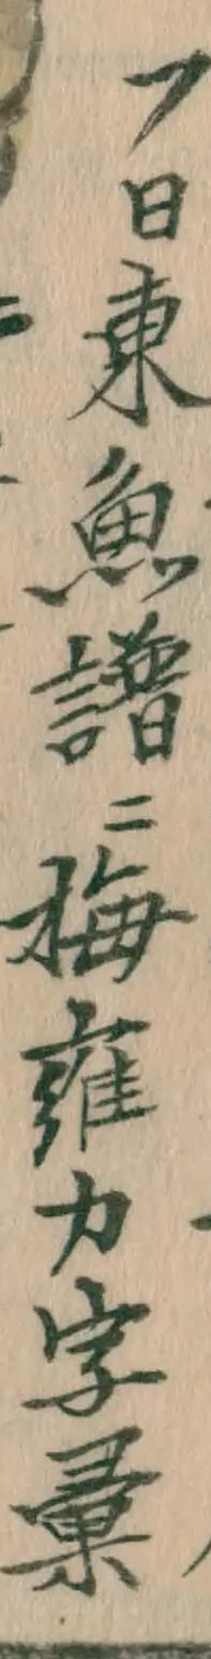フ日東魚譜ニ梅雍カ字彙
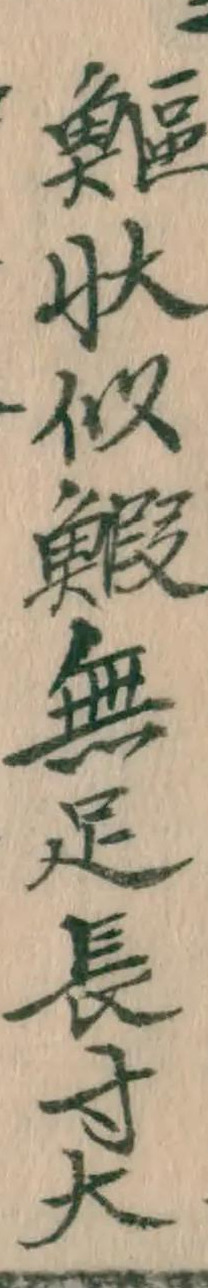ニ鰸状似鰕無足長寸大
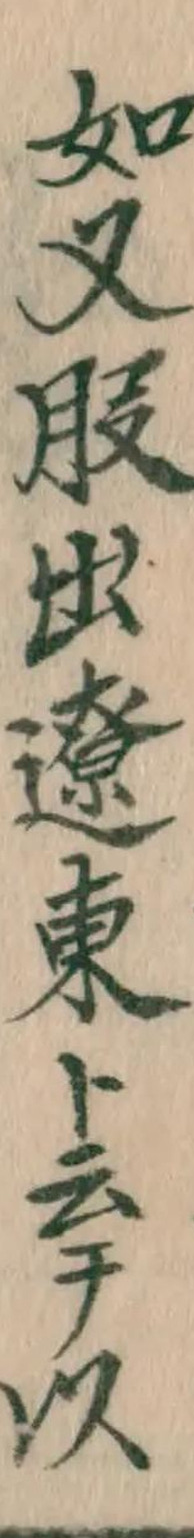如又股出遼東ト云ヲ以
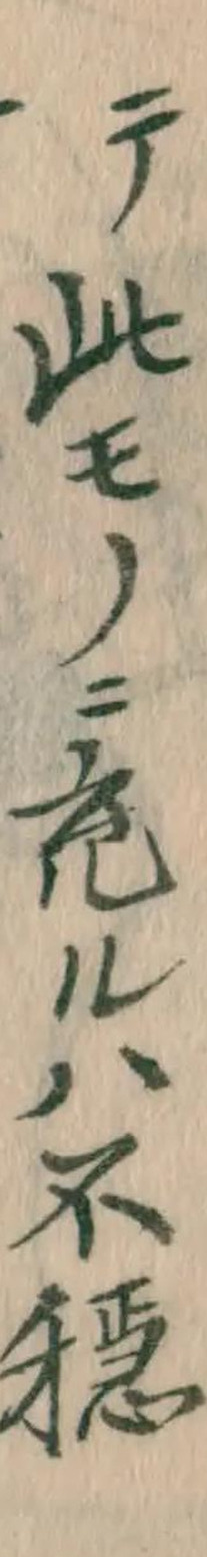テ此モノニ充ルハ不穏
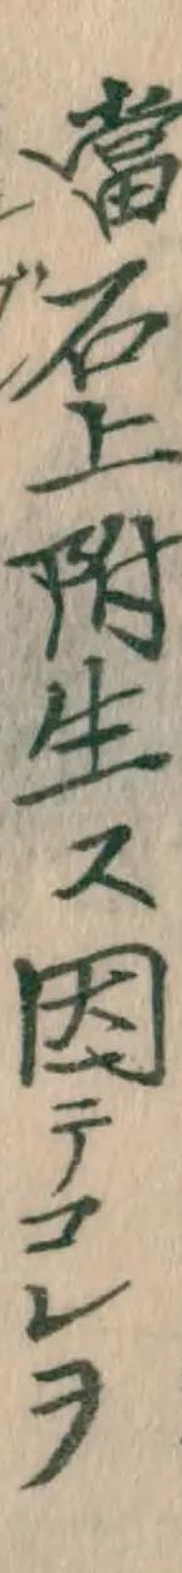當石上附生ス因テコレヲ
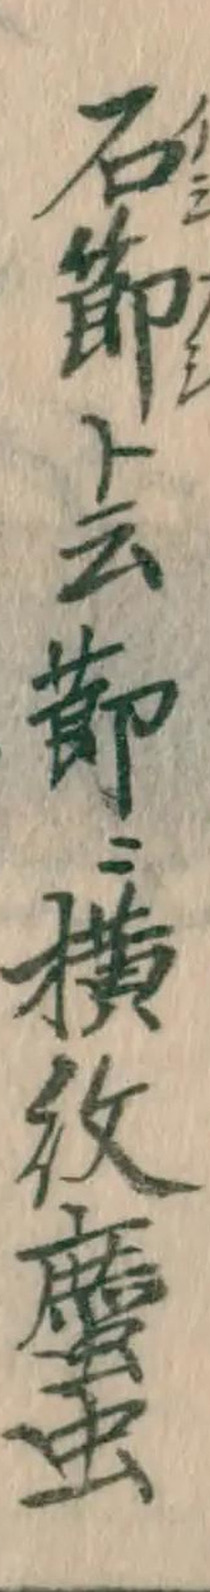石節ト云莭ニ横紋䗪虫
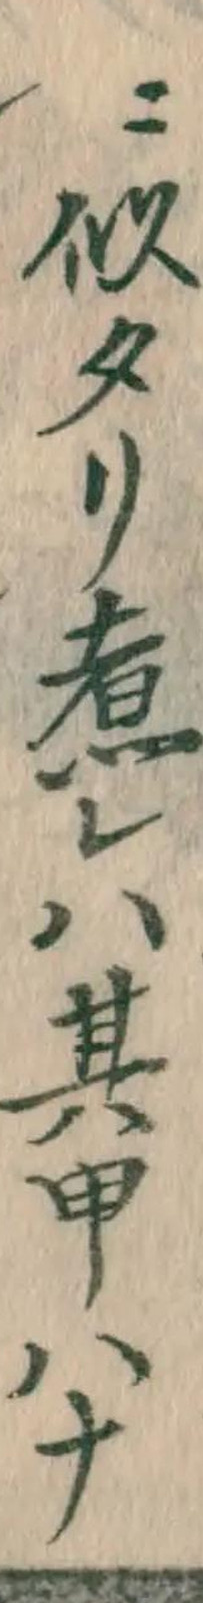ニ似タリ煮レハ其甲ハナ
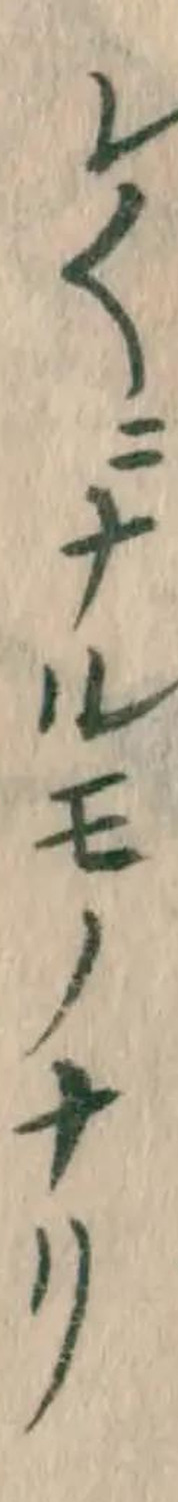レ〳〵ニナルモノナリ
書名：千蟲譜 3巻. [1]
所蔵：国立国会図書館 National Diet Library, JAPAN
